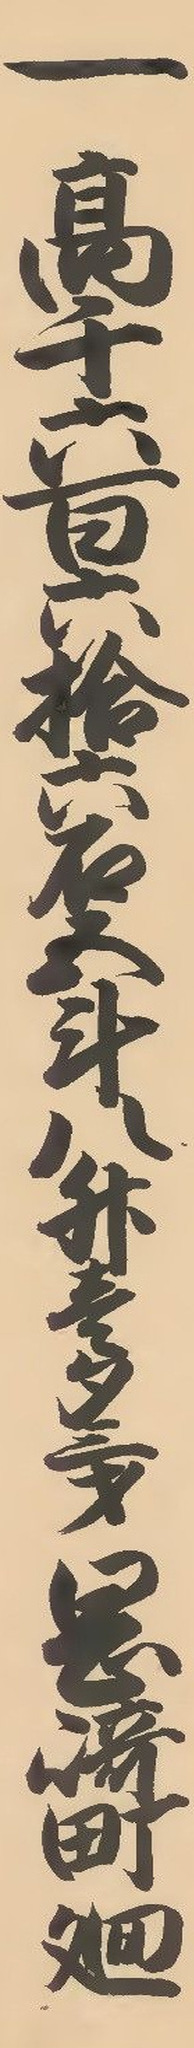一高千六百六拾六石五斗八升壱勺三才岡崎町廻
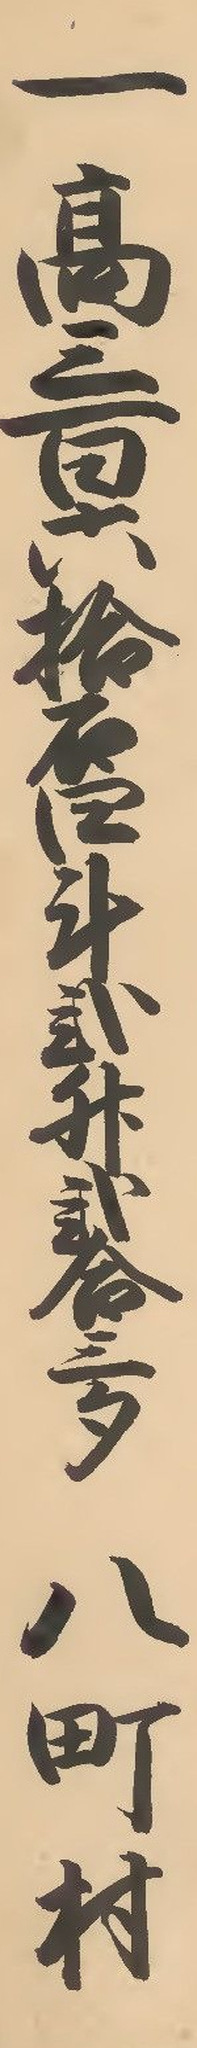一高三百六拾石四斗弐升弐合三勺八町村

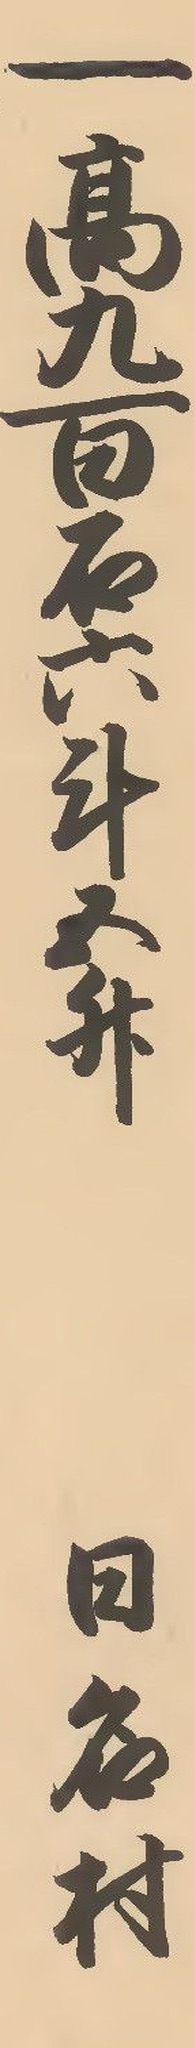一高九百石六斗五升日名村
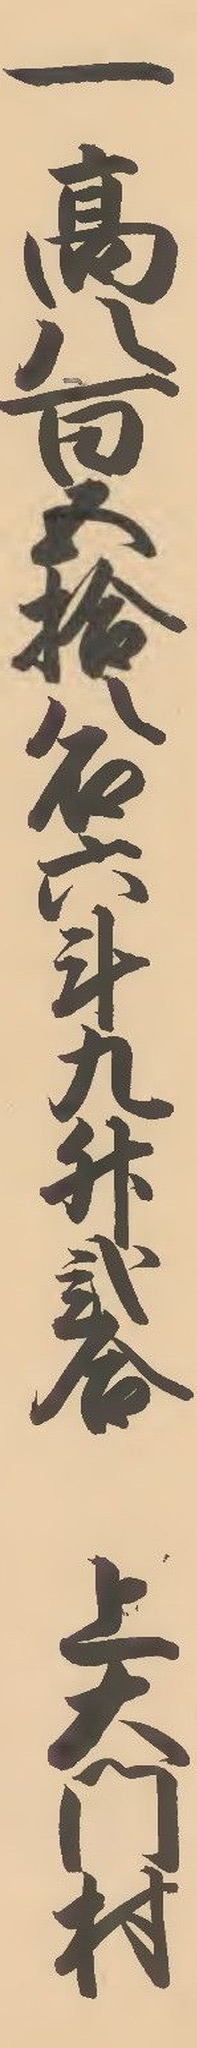一高八百五拾八石六斗九升弐合上大門村
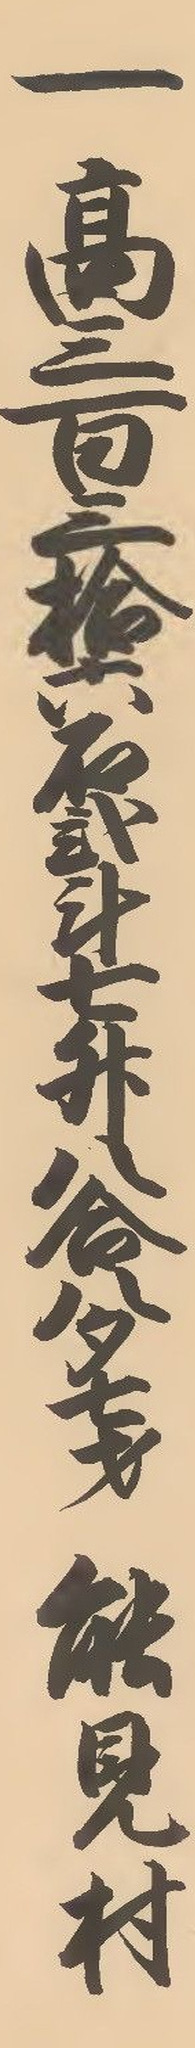一高三百三拾六石弐斗七升八合八勺七才能見村
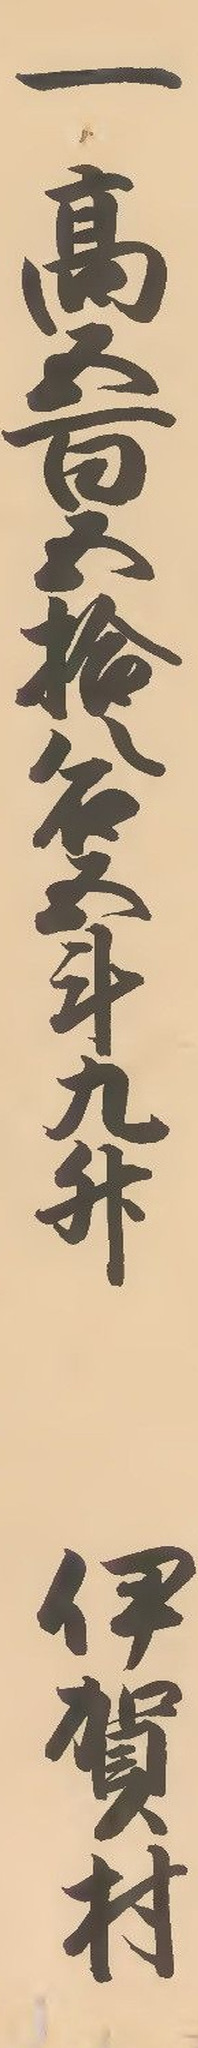一高五百五拾八石五斗九升伊賀村
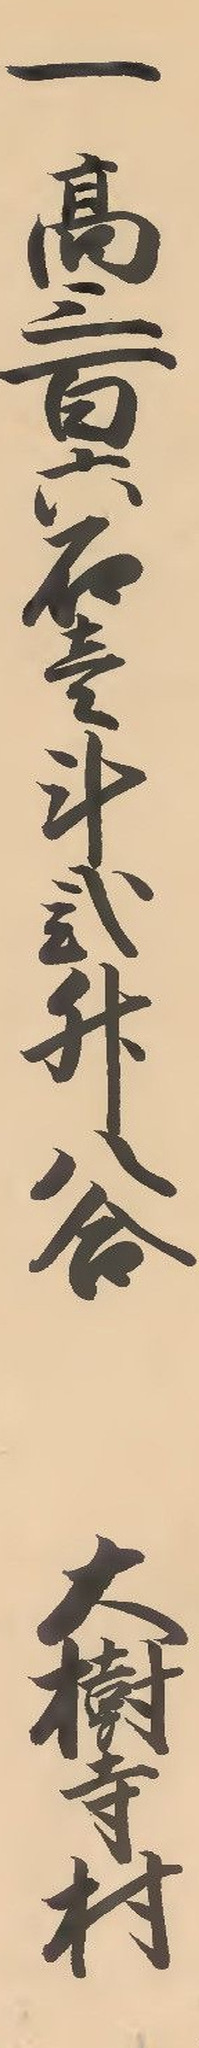一高三百六石壱斗弐升八合大樹寺村
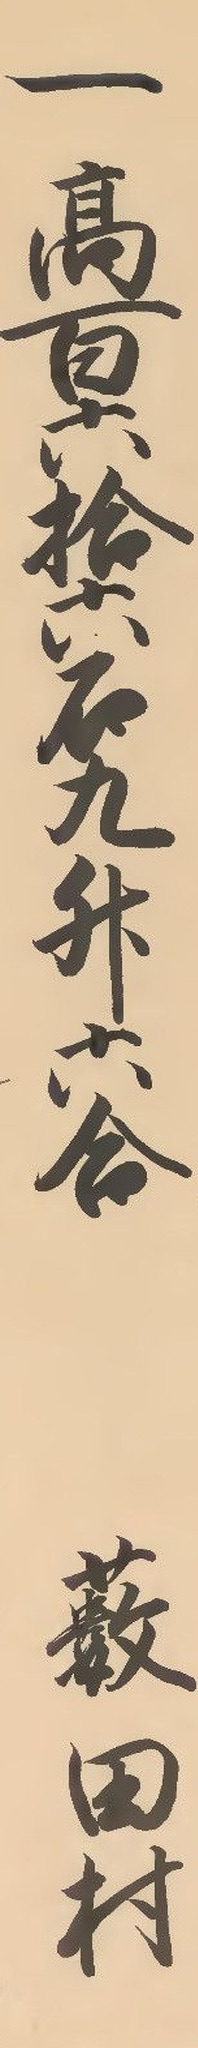一高百六拾六石九升六合薮田村
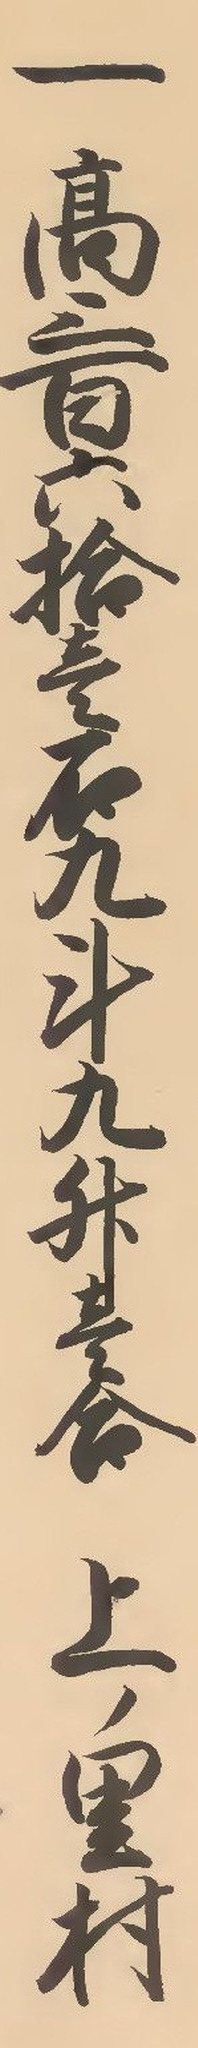一高三百六拾壱石九斗九升壱合上ノ里村
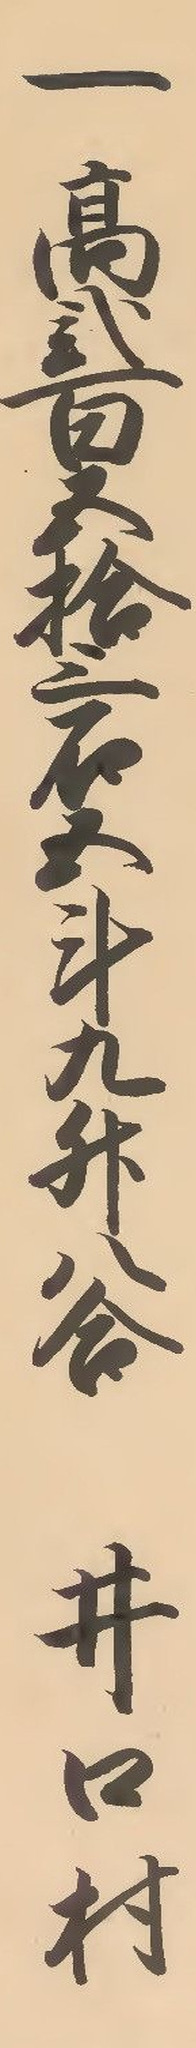一高弐百五拾三石五斗九升八合井口村

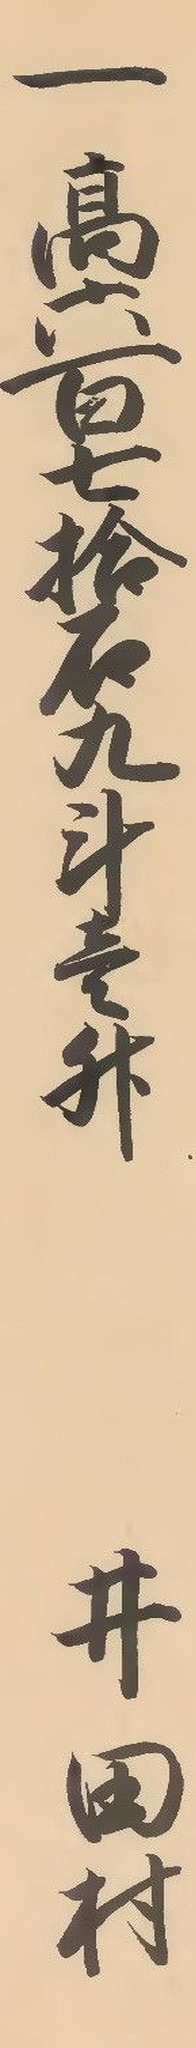一高六百七拾石九斗壱升井田村
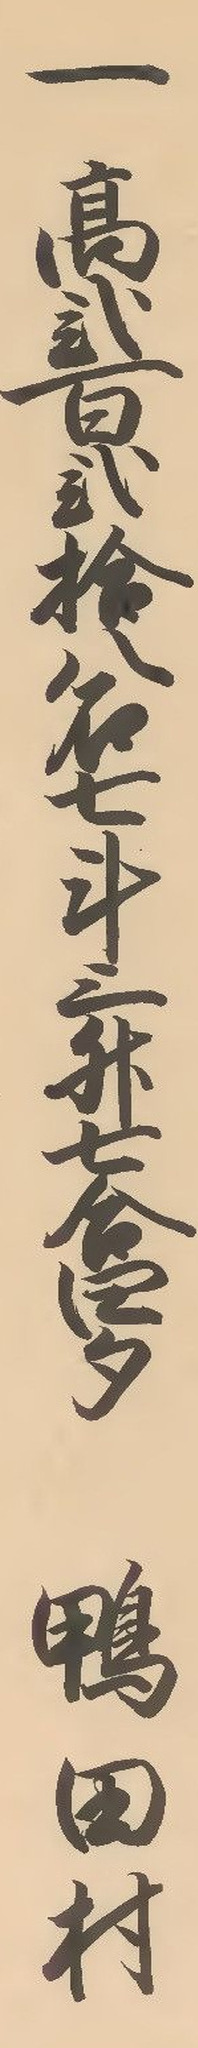一高弐百弐拾八石七斗三升七合四勺鴨田村
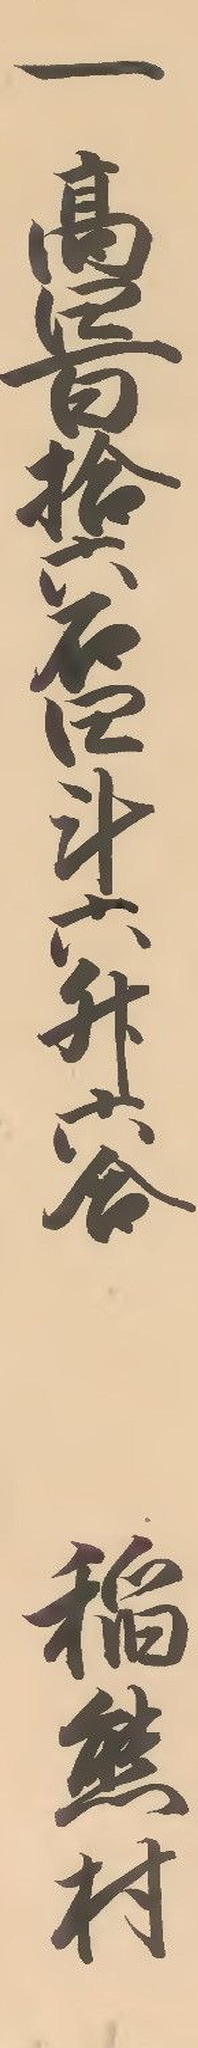一高四百拾六石四斗六升六合稲熊村
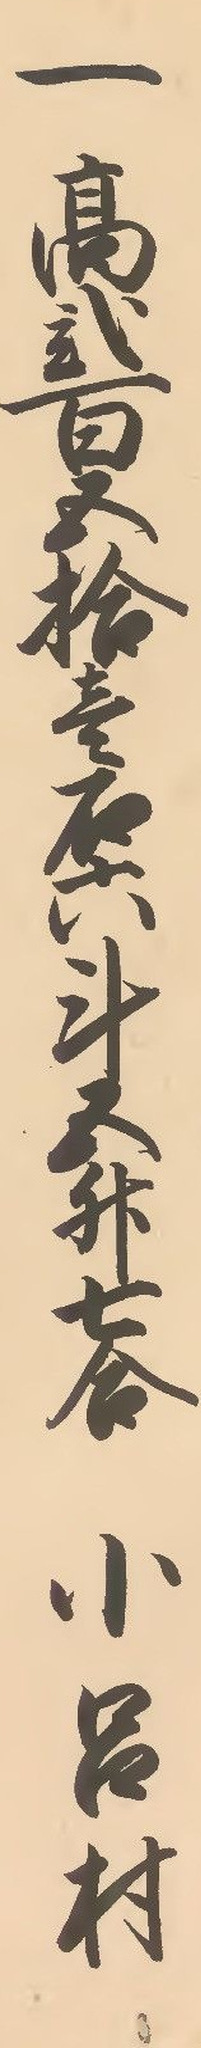一高弐百五拾壱石六斗五升七合小呂村
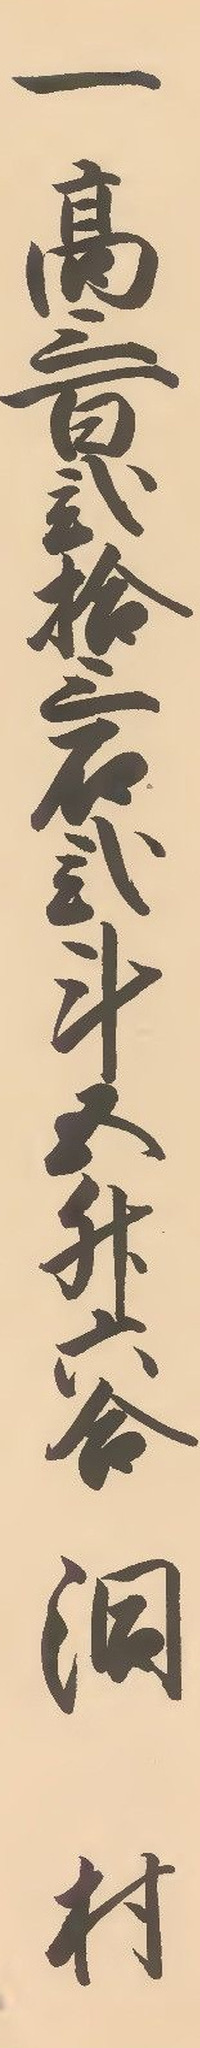一高三百弐拾三石弐斗五升六合洞村
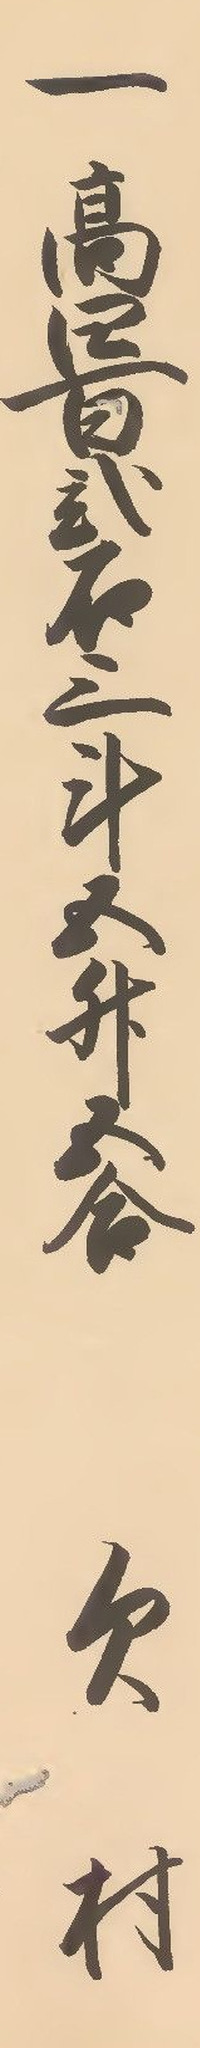一高四百弐石三斗五升五合欠村
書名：三河国郷帳
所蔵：国立公文書館 National Archives of Japan
